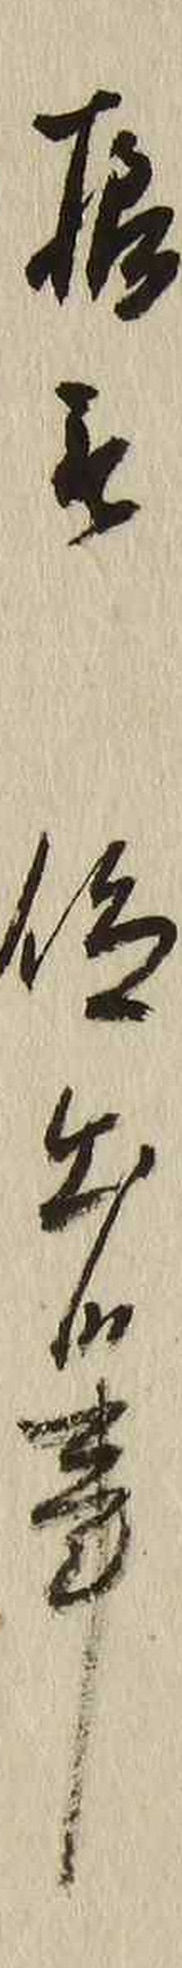様被仰出候事
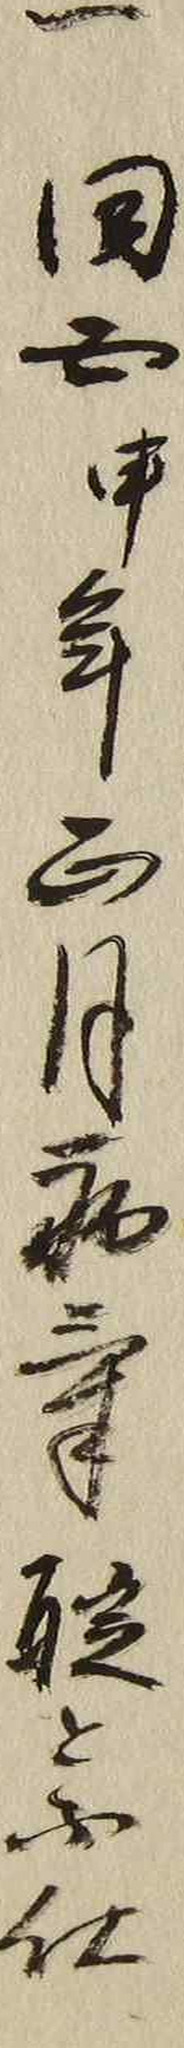一同五申年正月病気聢と不仕
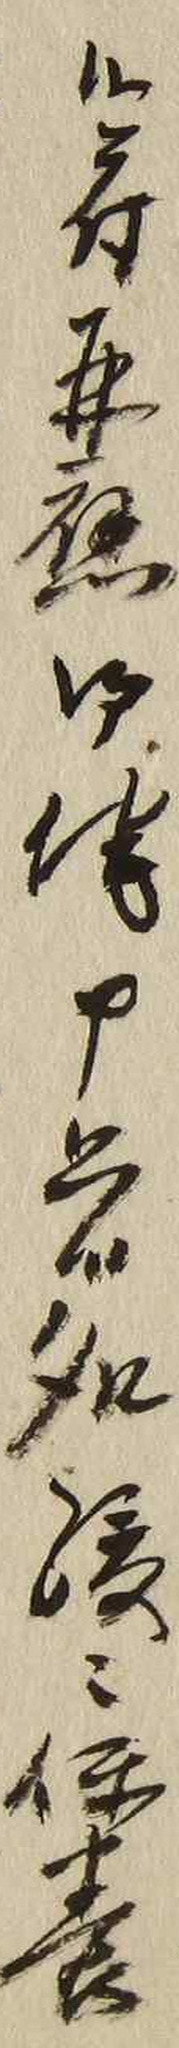候ニ付再応御侘申上候処緩々保養
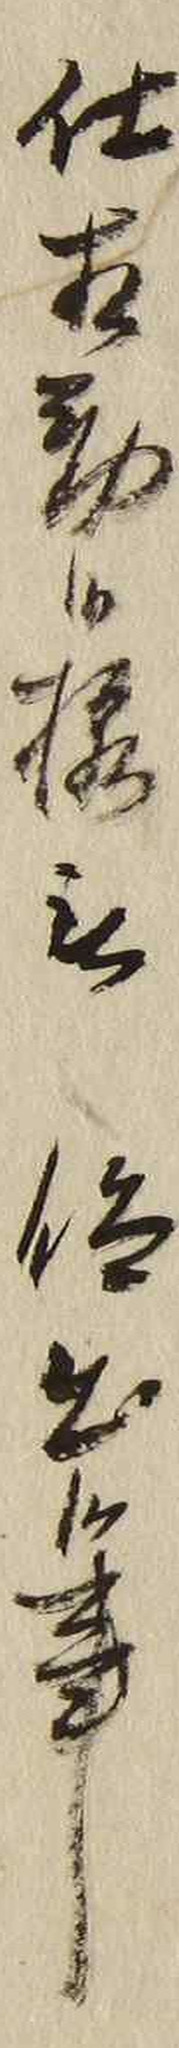仕相勤候様被仰出候事

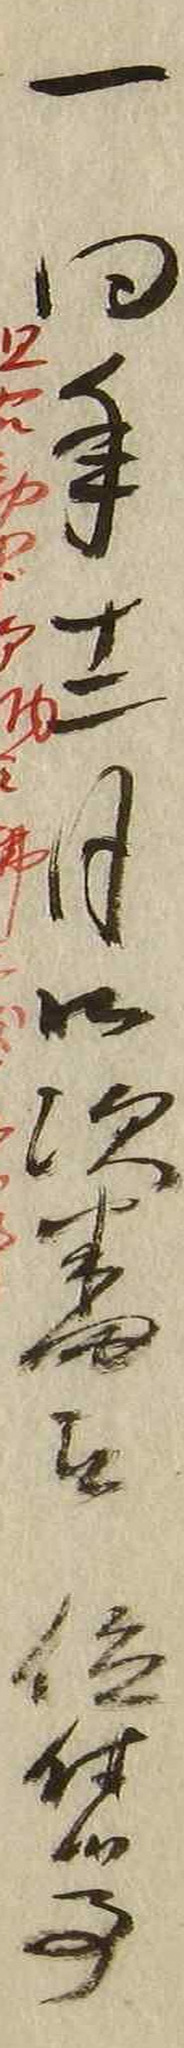一同年十二月御次番被仰付候事
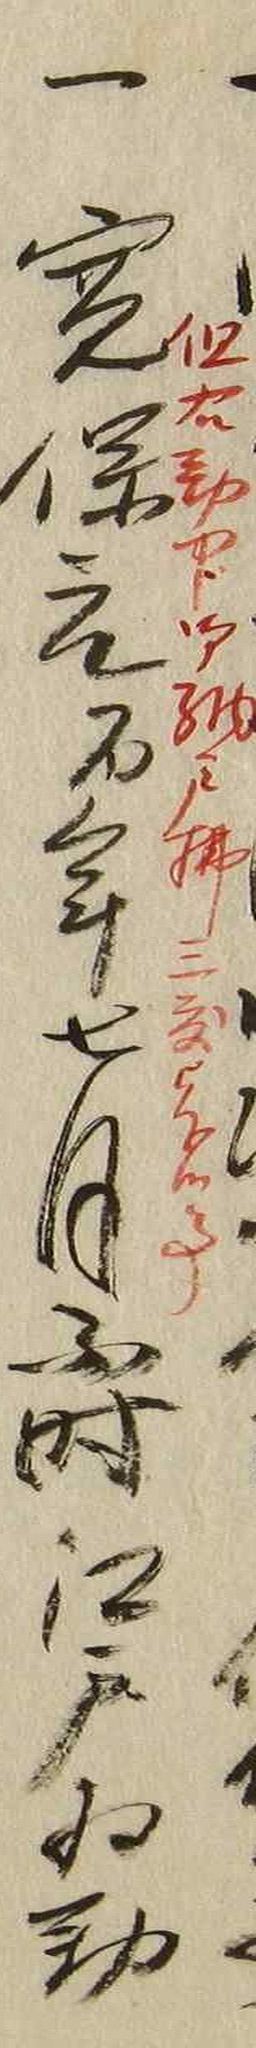一寛保元酉年七月不時江戸為勤
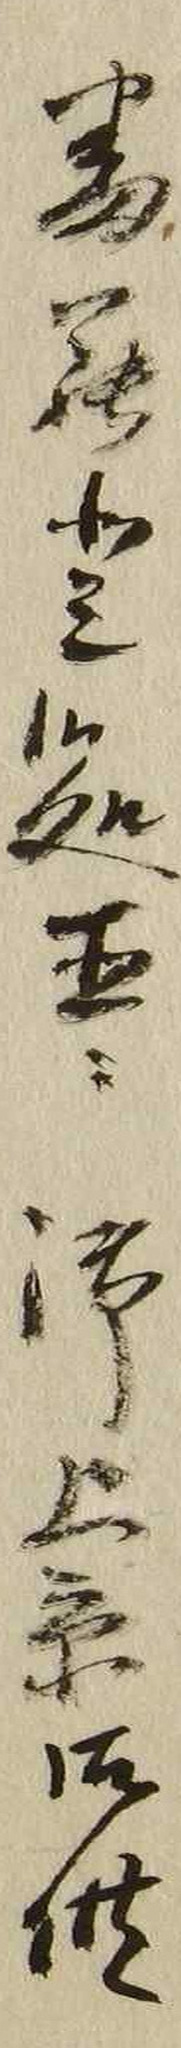番罷登候処直ニ御上京御供
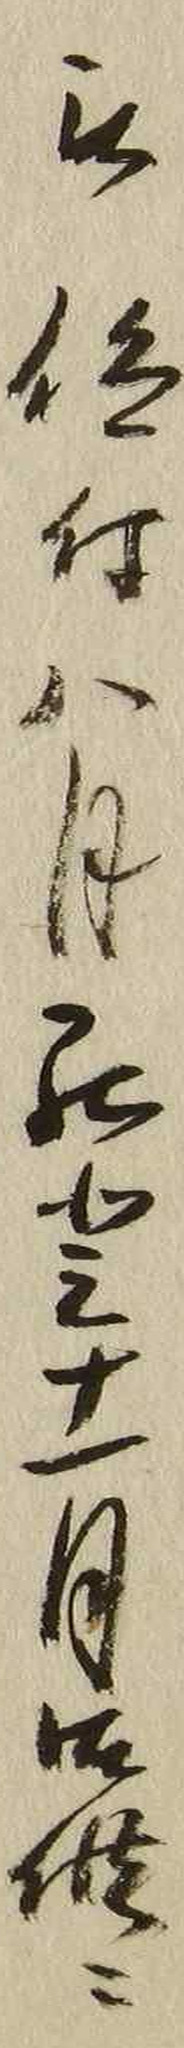被仰付八月罷登十一月御供ニ
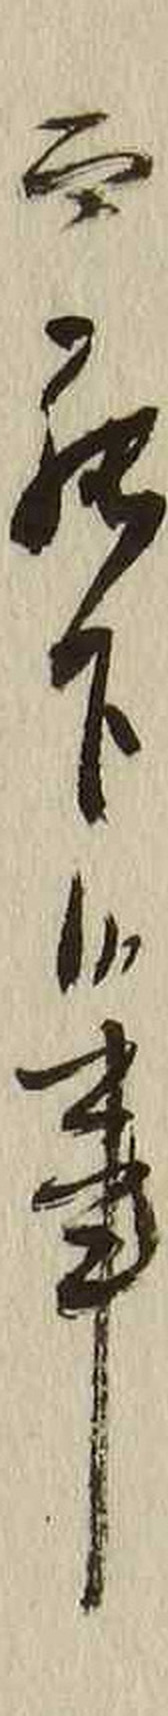而罷下候事
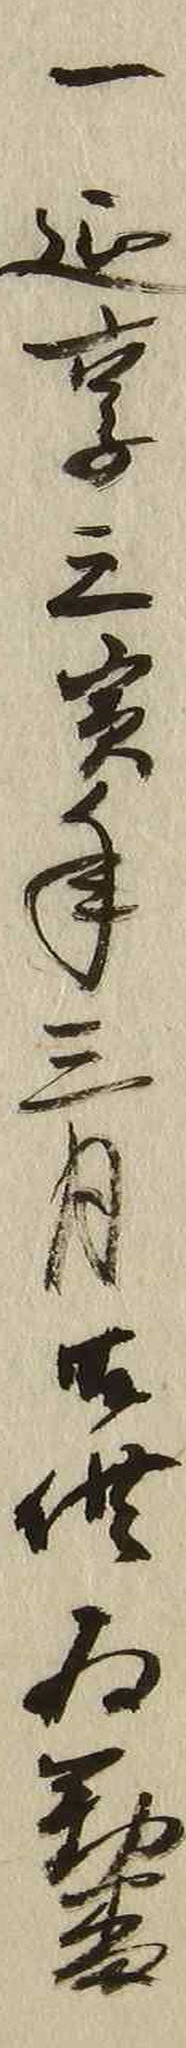一延享三寅年三月御供為勤番
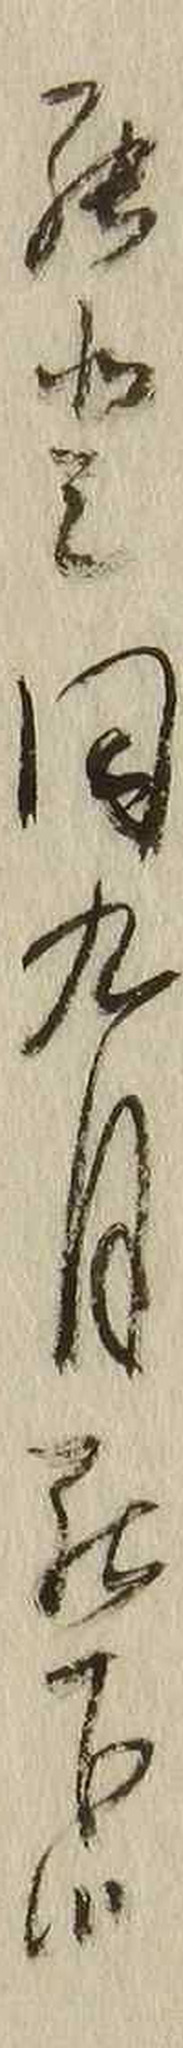罷登同九月罷下候
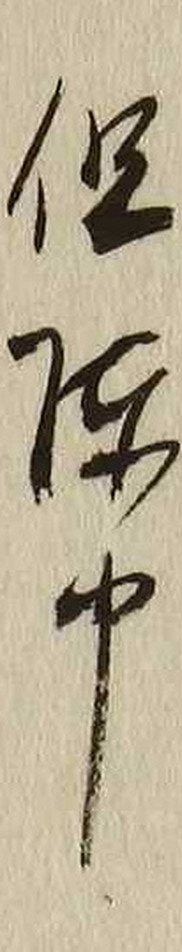但陳中
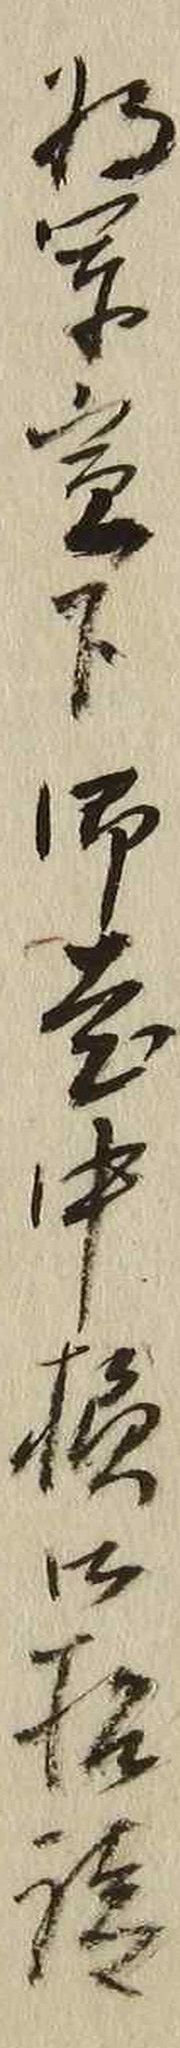将軍宣下御老中様御招請
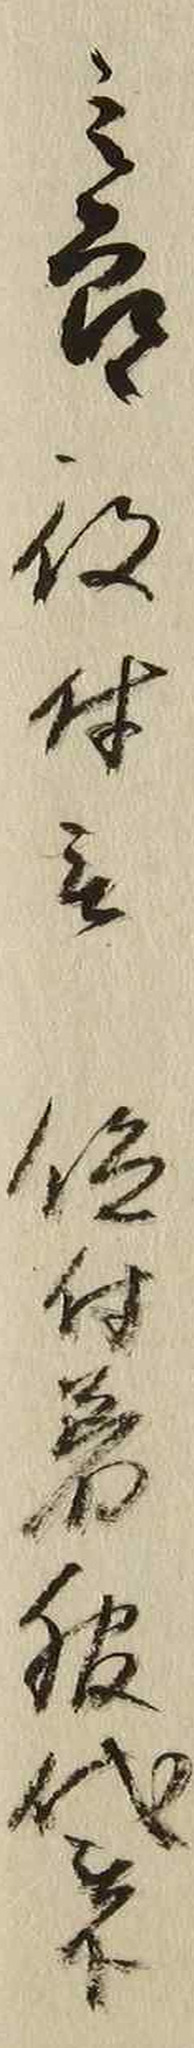之節役付被仰付着服代被下
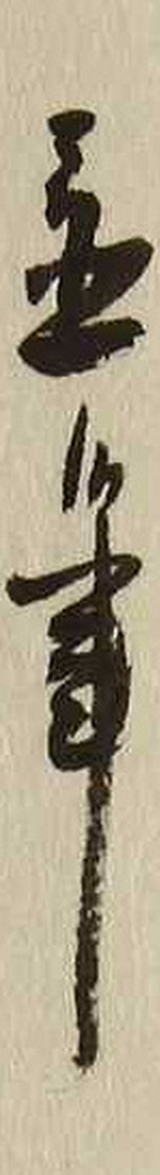置候事
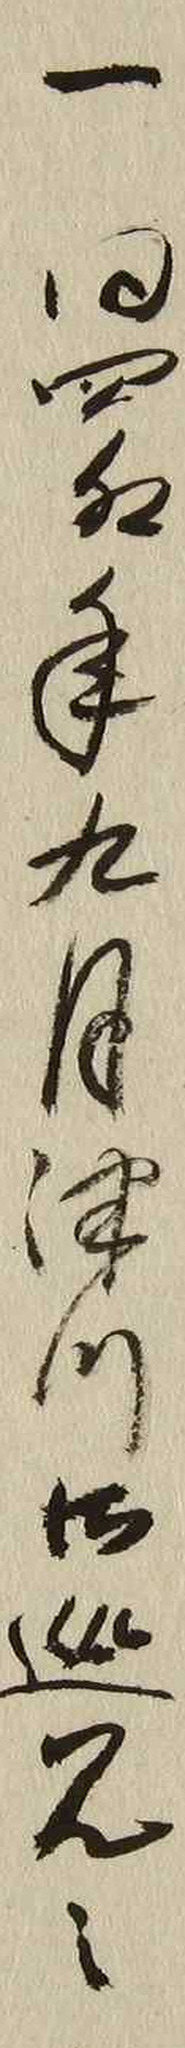一同四卯年九月津川御巡見之
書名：諸士系譜　巻之346　も之部2
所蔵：会津若松市立会津図書館
